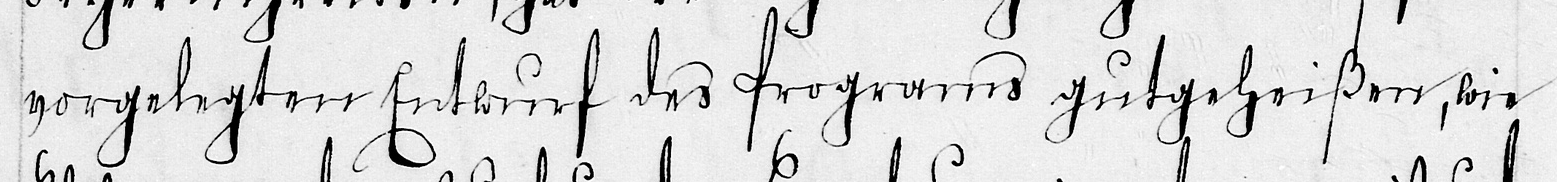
vorgelegten Entwurf des Programs gutgeheißen, wie
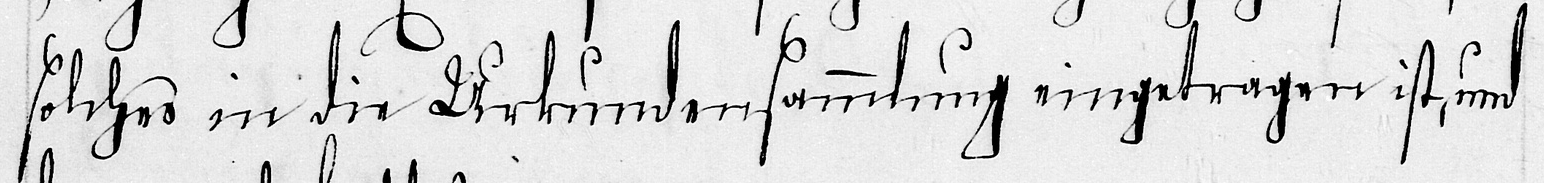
solches in die Urkundensammlung eingetragen ist,
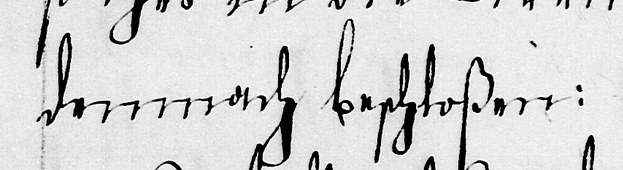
demnach beschloßen:
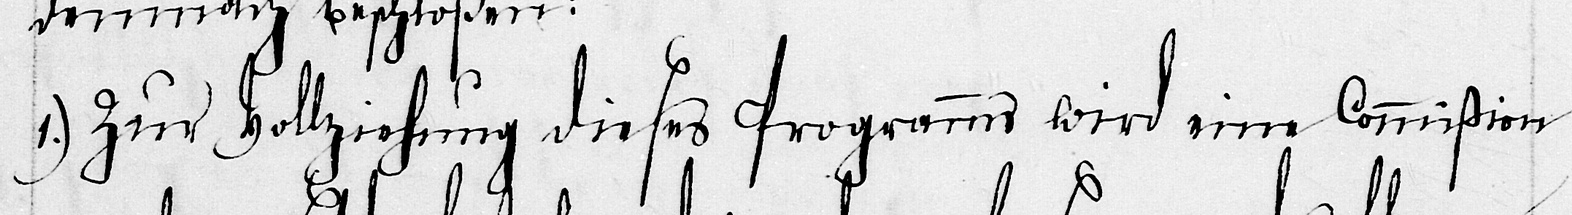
1.) Zur Vollziehung dieses Programms wird eine Commißion
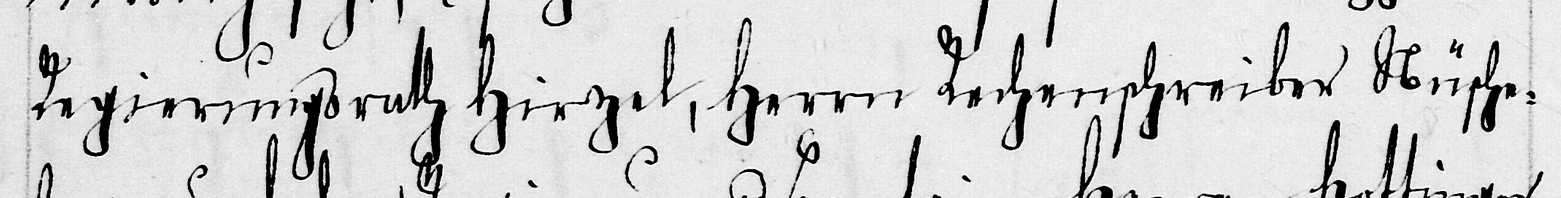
Regierungsrath Hirzel, Herrn Rechenschreiber Nüsche¬
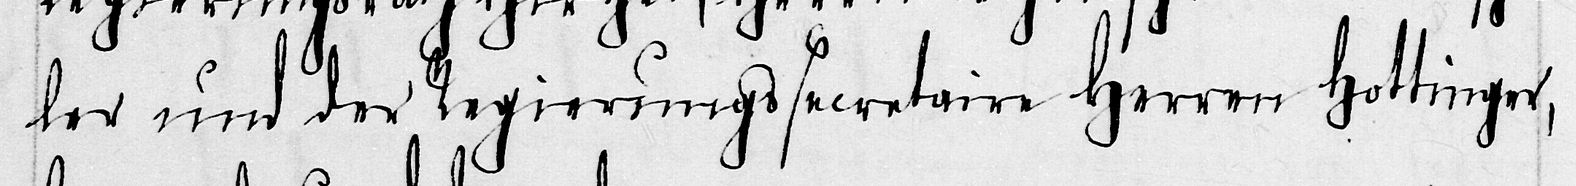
ler und der Regierungssecretaire Herren Hottinger,
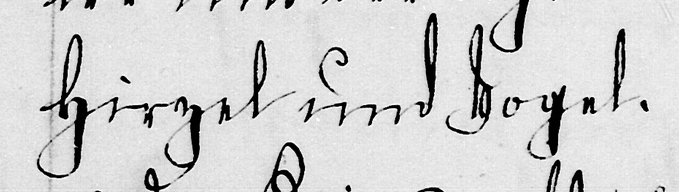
Hirzel und Vogel.
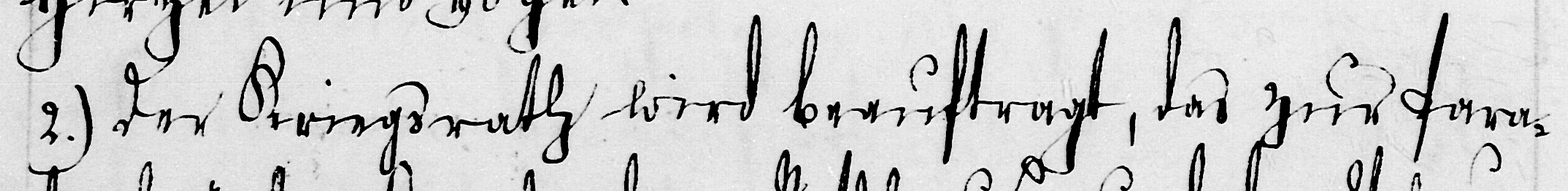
2.) Der Kriegsrath wird beauftragt, das zur Para¬
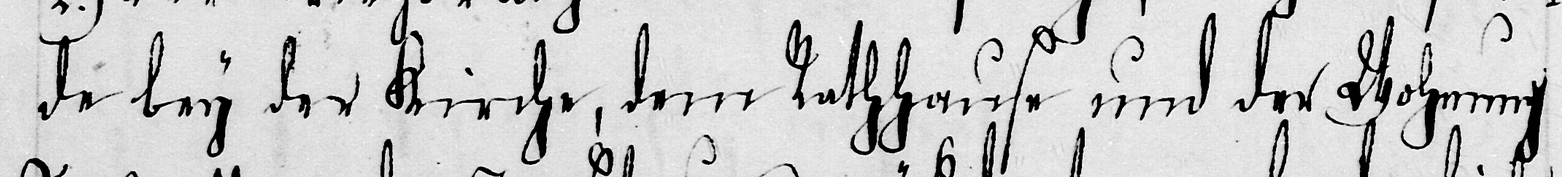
de bey der Kirche, dem Rathhause und der Wohnung
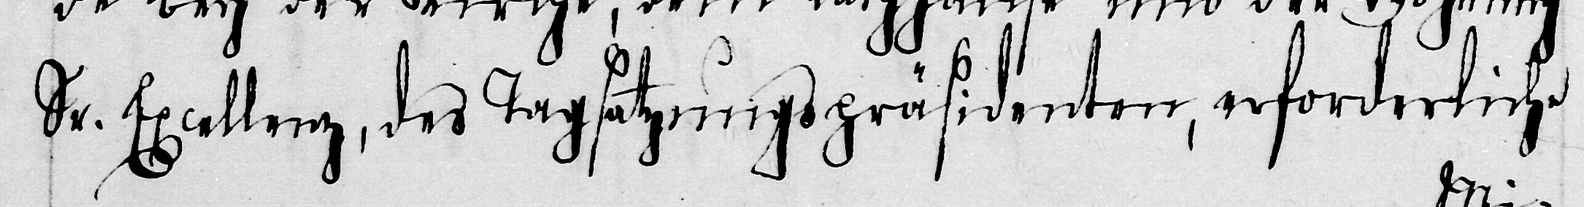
Sr. Excellenz, des Tagsatzungspräsidenten, erforderliche
